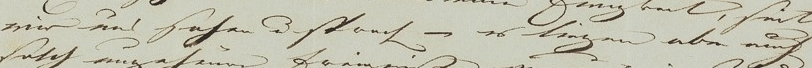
wir uns sahen u. sprachen – es liegen aber auch
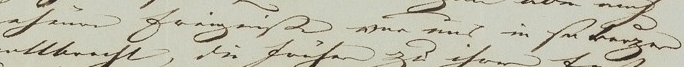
ungeheure Ereigniße vor und in so kurzer
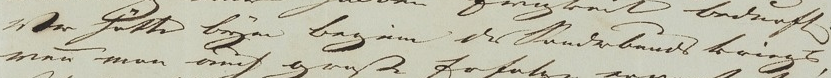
Wer hätte beim Beginn des Sonderbundskriegs,
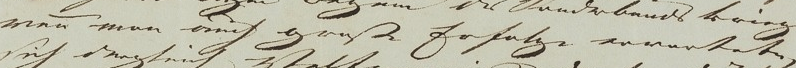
wenn man auch große Erfolge erwartete,
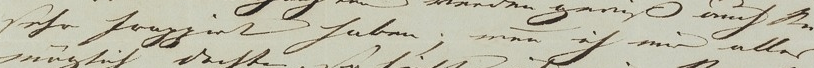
sehr frappirt haben; wenn ich mir alles
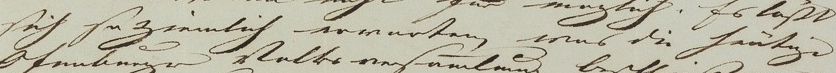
sich so ziemlich erwarten, was die heutige
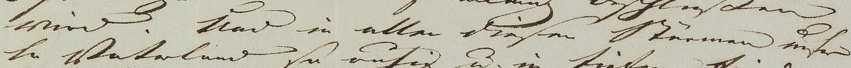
wird. Und in allen diesen Stürmen unser
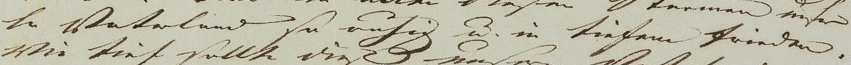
l. Vaterland so ruhig u. in tiefem Frieden.
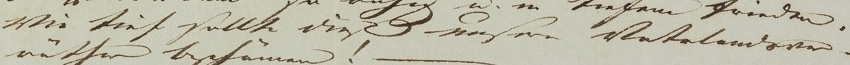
Wie tief sollte dieß unsere Vaterlandsver-
